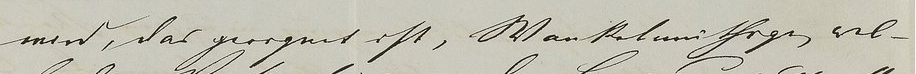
wird, das geeignet ist, Wankelmüthige, wel-
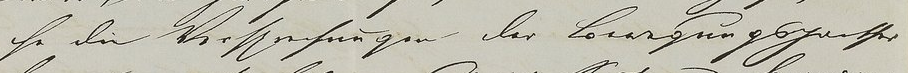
che die Versprechungen der Bewegungsparthei
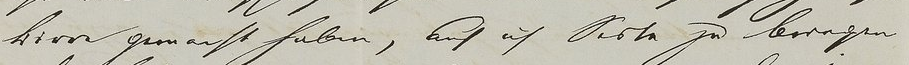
kirre gemacht haben, auf unsere Seite zu bringen
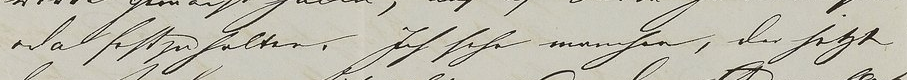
da festzuhalten. Ich sehe manchen, der jetzt
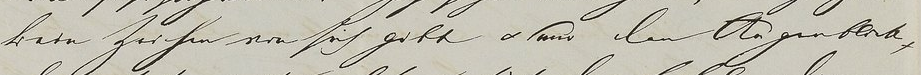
kein Zeichen von sich gibt & nur den Augenblick
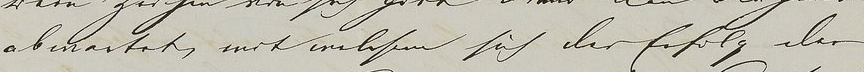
abwartet, mit welchem sich der Erfolg der
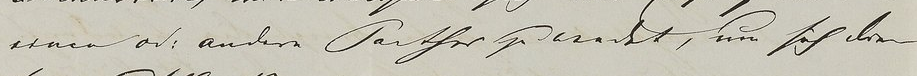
einen od: andern Parthei zuwendet, um sich die-
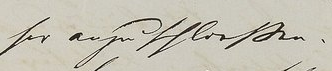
ser anzuschließen.
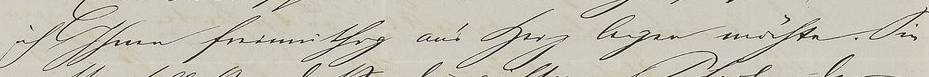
ich Ihnen freimüthig an's Herz legen möchte. Sie
